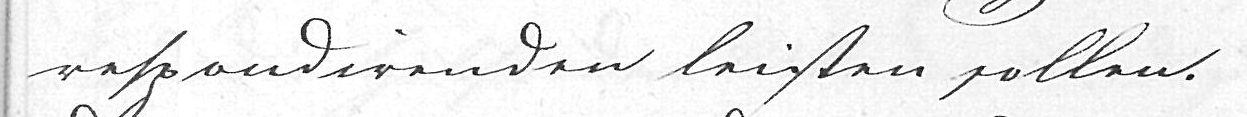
respondirenden leisten sollen.
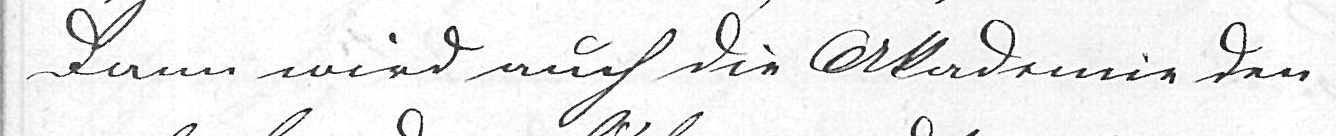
Dann wird auch die Akademie den
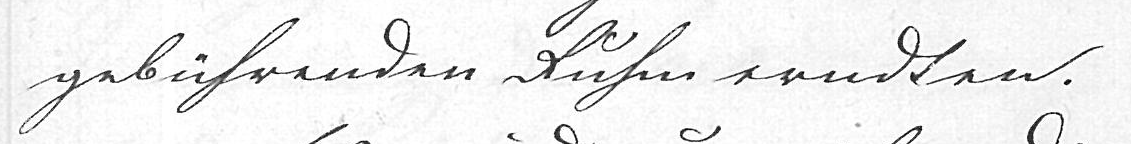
gebührenden Ruhm erndten.
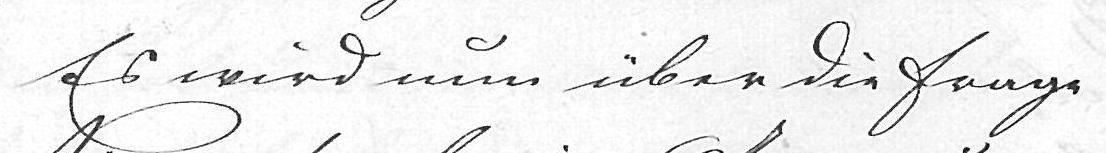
Es wird um über die Frage
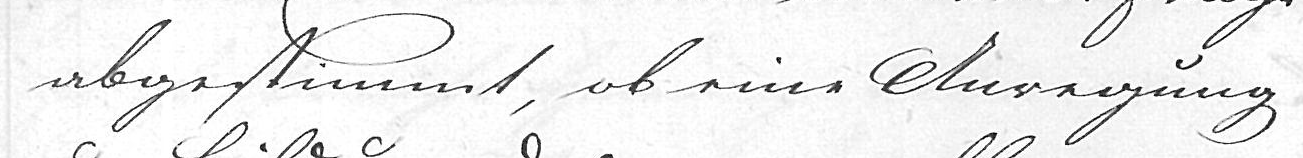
abgestimmt, ob eine Anregung
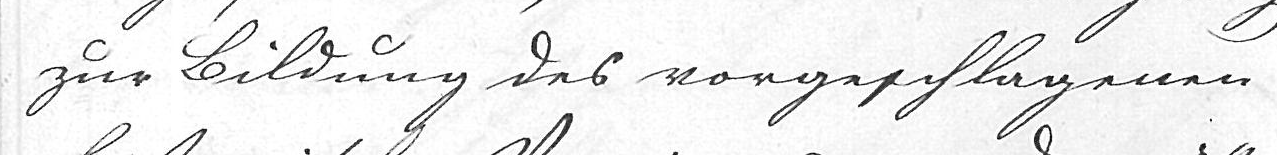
zur Bildung des vorgeschlagenen
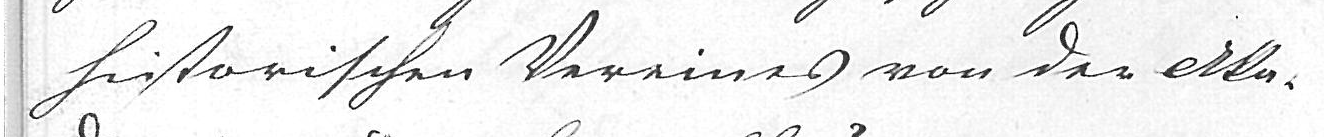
historischen Vereines von der Aka-
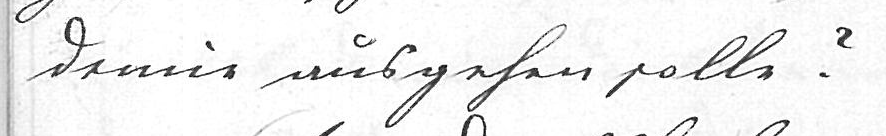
demie ausgehen solle?
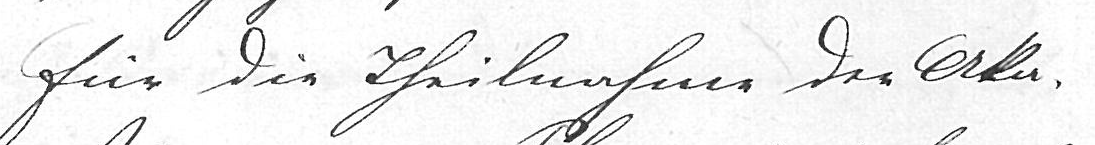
Für die Theilnahme der Aka-
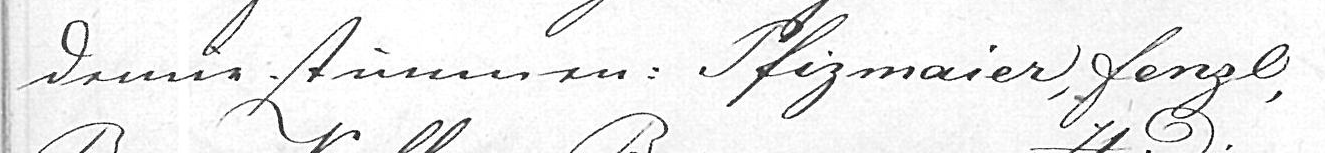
demie stimmen: Pfizmaier, Fenzl,
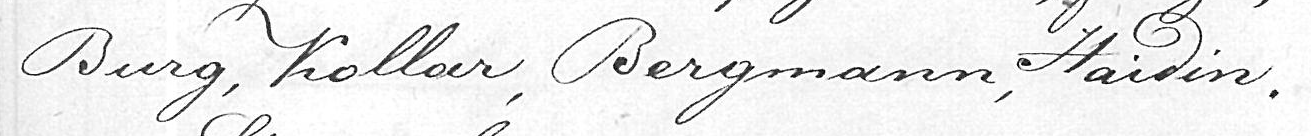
Burg, Kollar, Bergmann, Haidin-
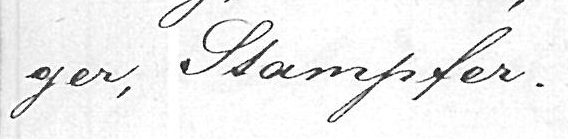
ger, Stampfer.
